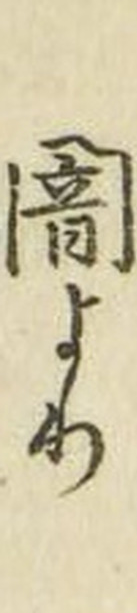闇より
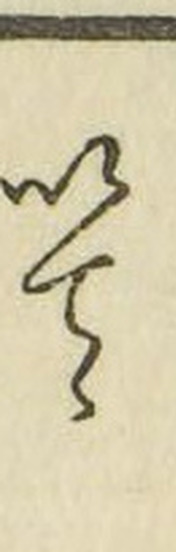いてゝ
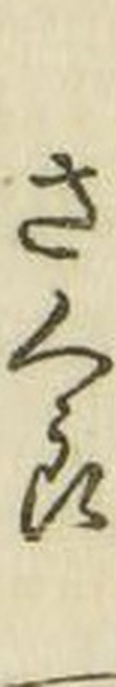さくら

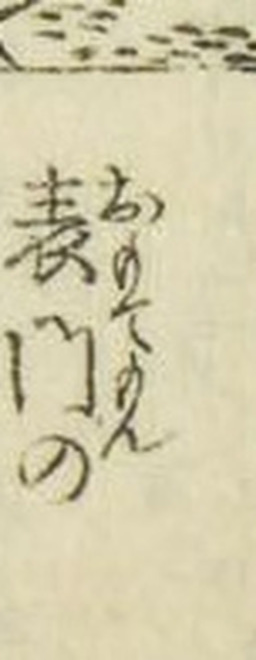表門の
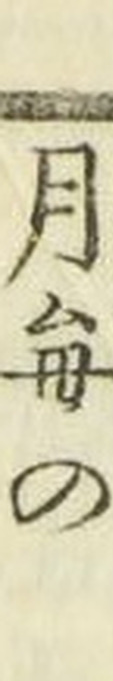月毎の
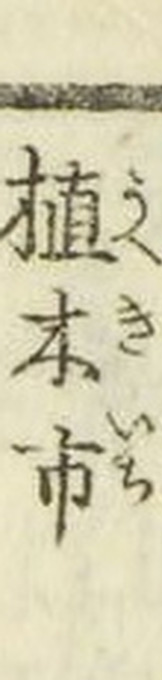植木市
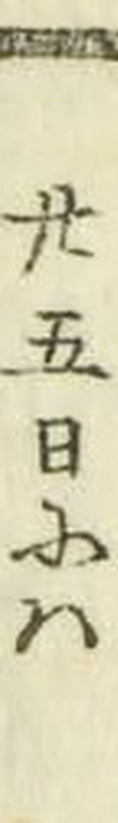廿五日には
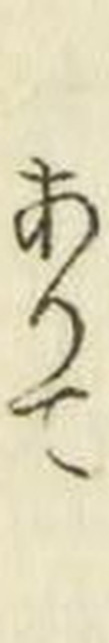ありて
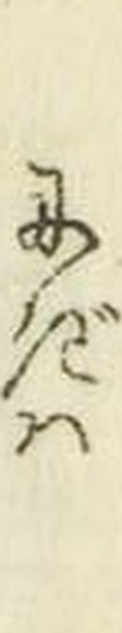にぎは
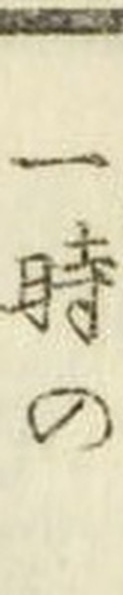一時の

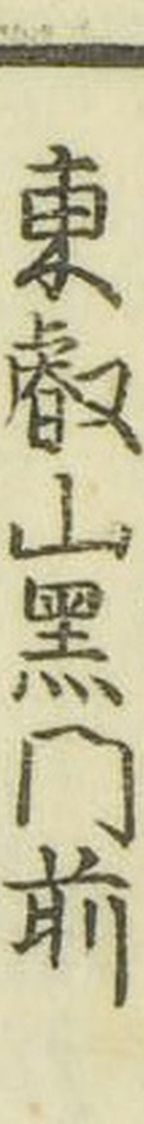東叡山黒門前
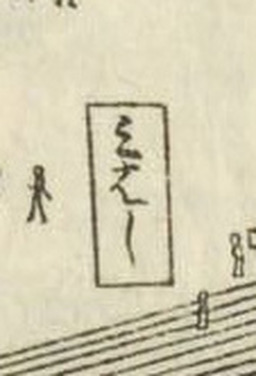みはし
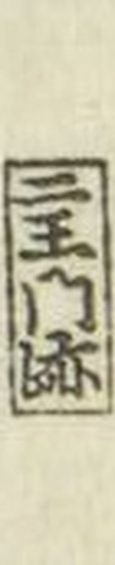二王門跡

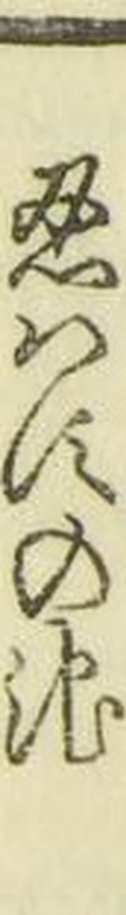忍はすの池
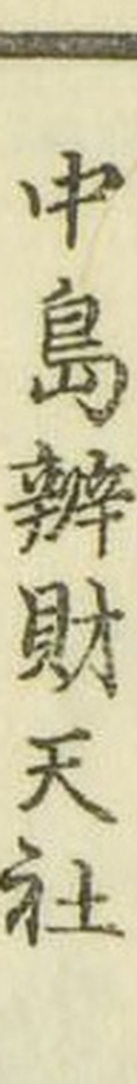中島辨財天社
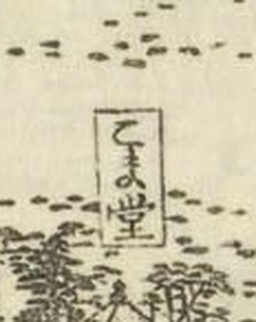こま堂
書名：江戸名所図会 20巻 巻之14
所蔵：東京学芸大学教育コンテンツアーカイブ
